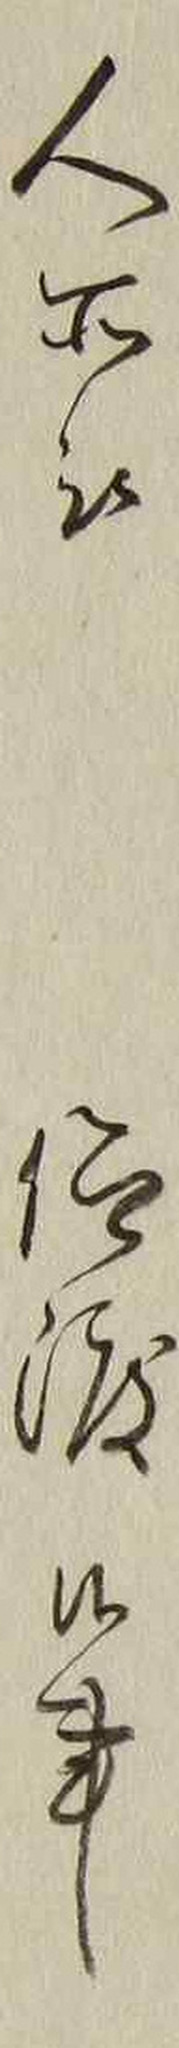人所被仰渡候事
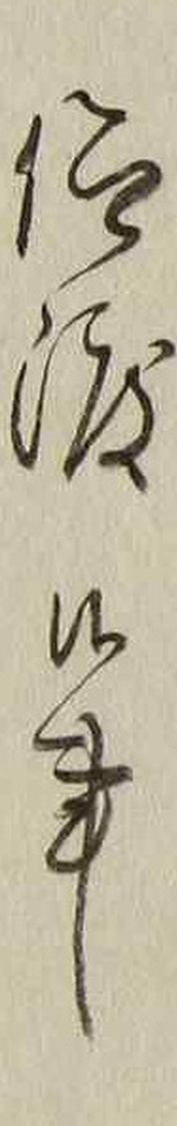仰渡候事
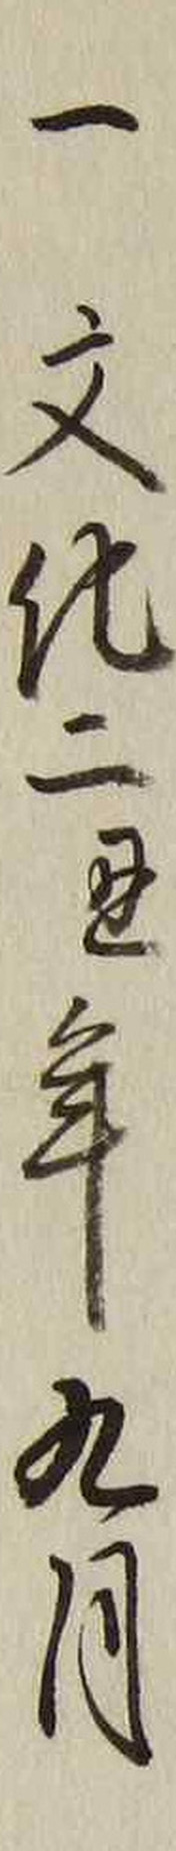一文化二丑年九月

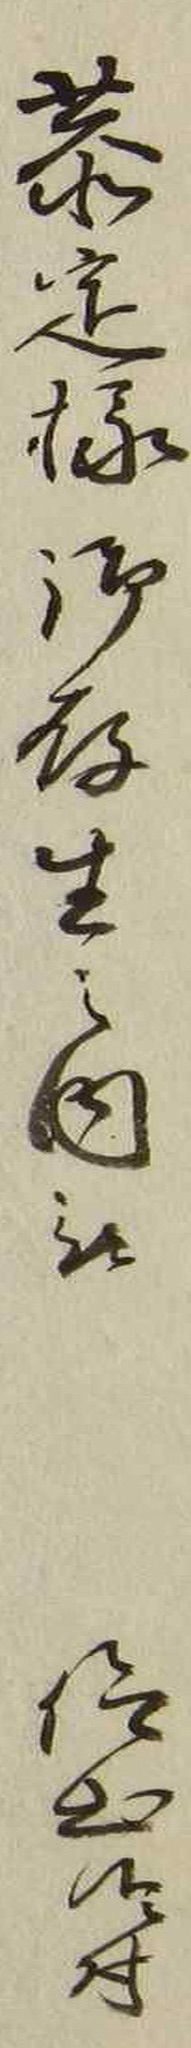恭定様御存生之内被仰出候ニ付
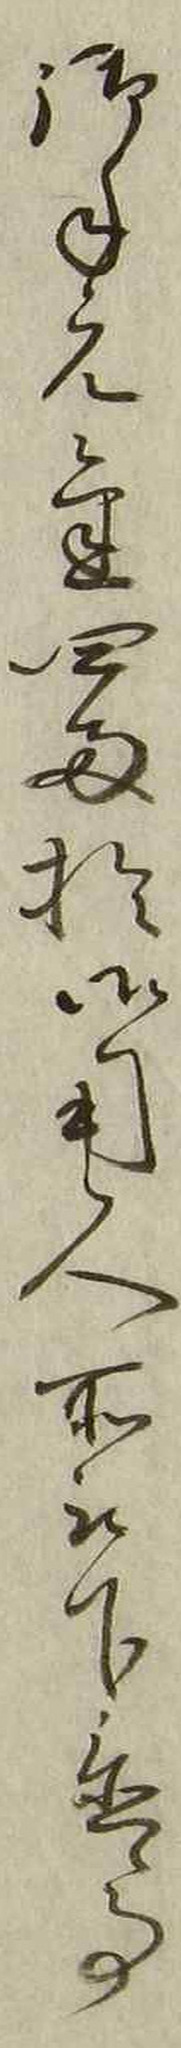御手元金四両於御用人所被下置候事
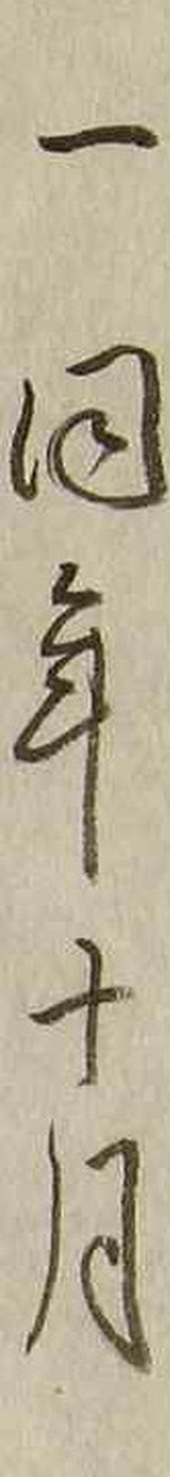一同年十月
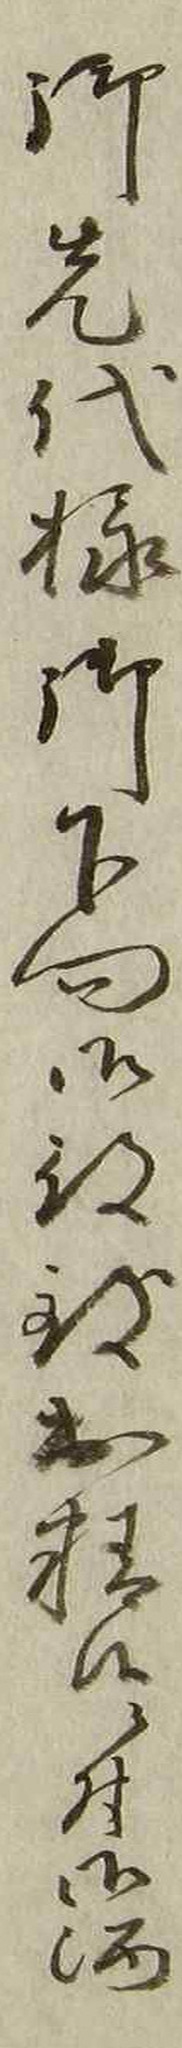御先代様御下向御役致出精候ニ付御酒
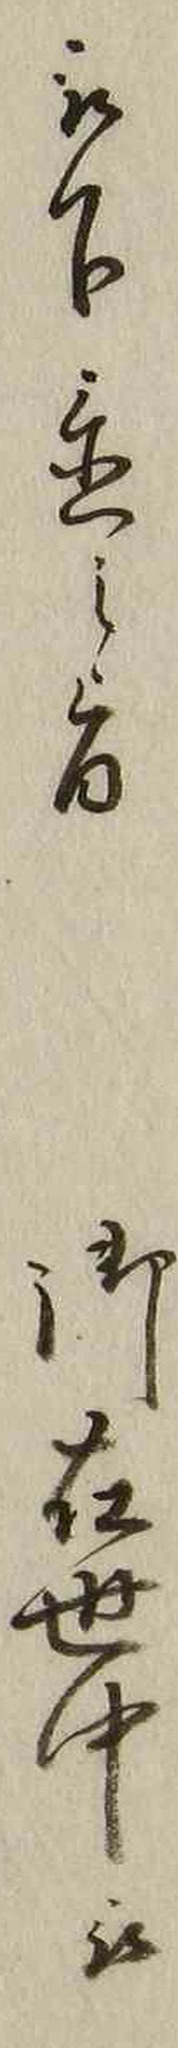被下置候旨御在世中被
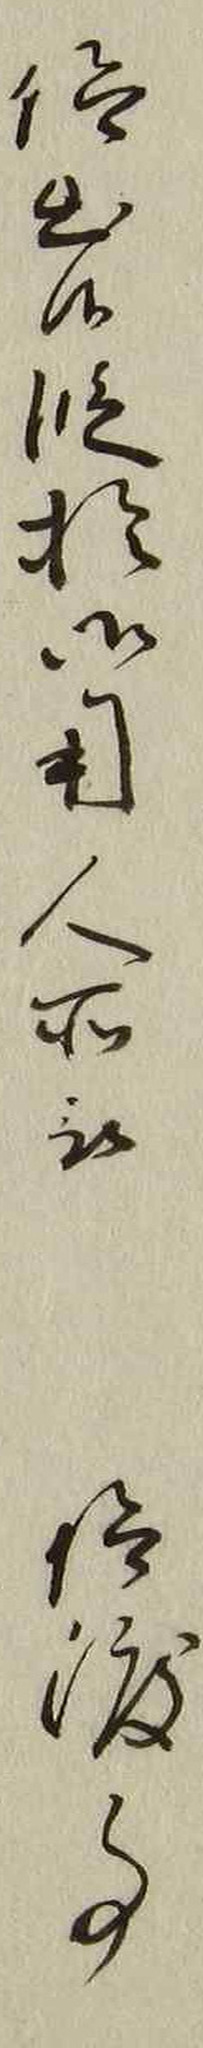仰出候段於御用人所被仰渡候事
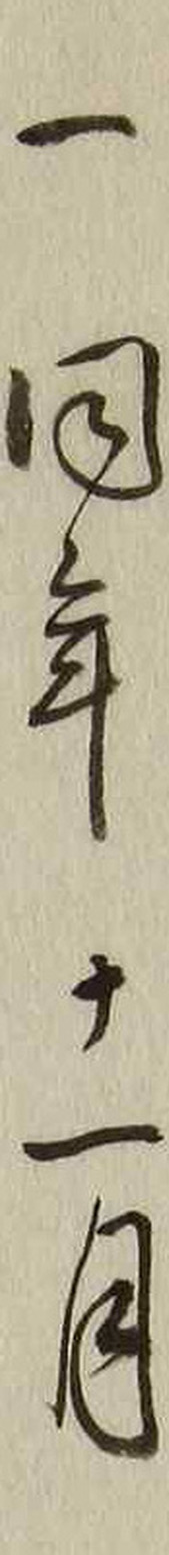一同年十一月
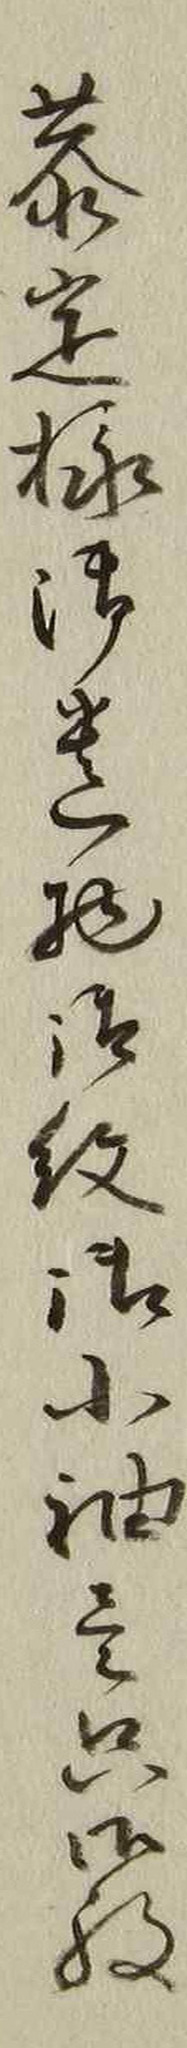恭定様御遺物御紋御小袖壱只御紋
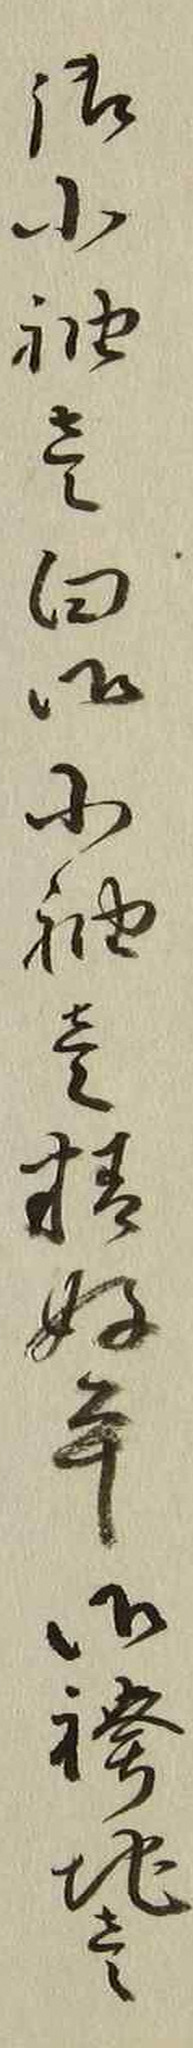御小袖壱白御小袖壱精好平御袴地壱
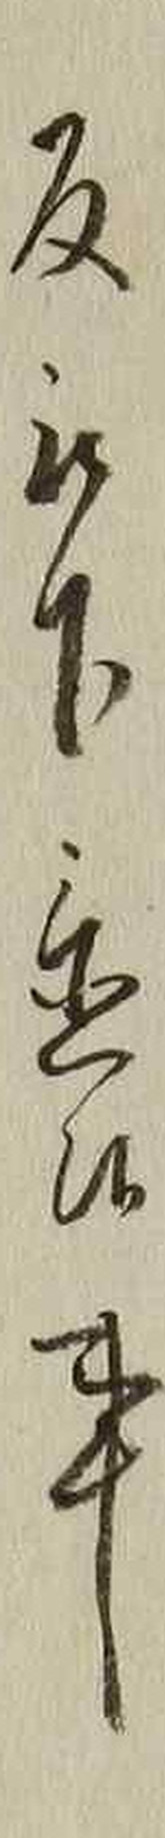反被下置候事
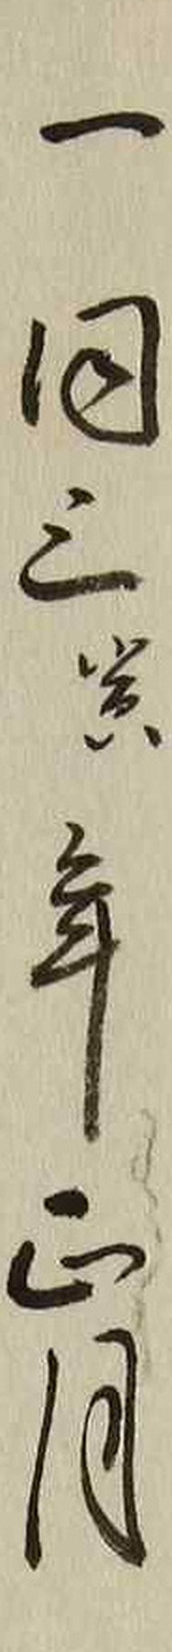一同三寅年正月
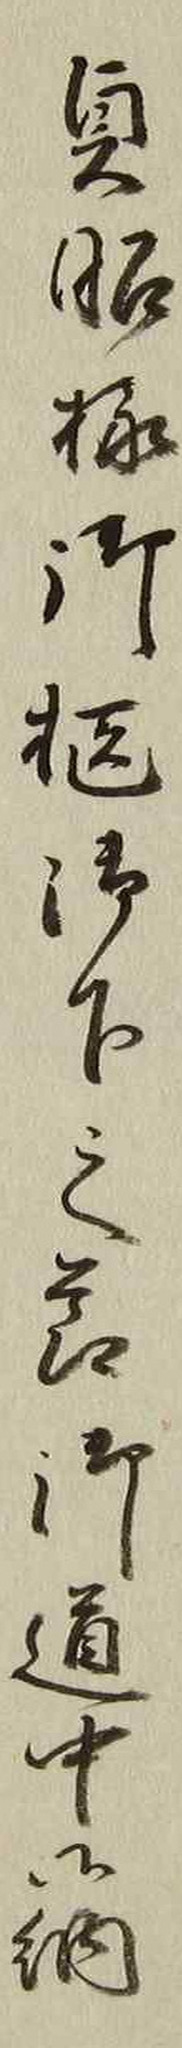貞昭様御柩御下之節御道中御納
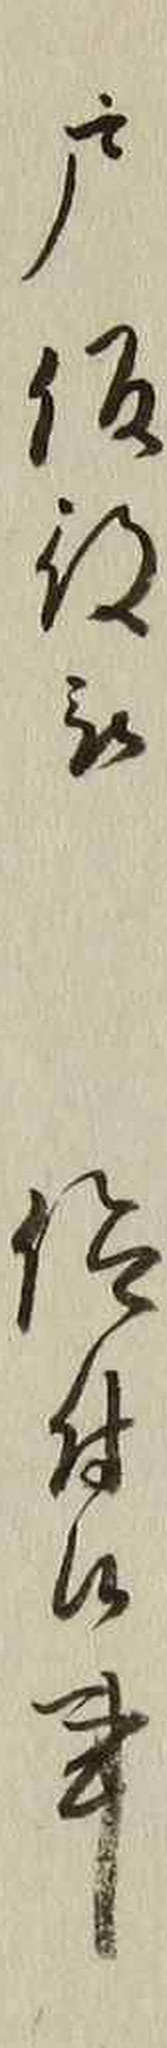戸仮役被仰付候事
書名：諸士系譜　巻之4　い之部4
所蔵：会津若松市立会津図書館
